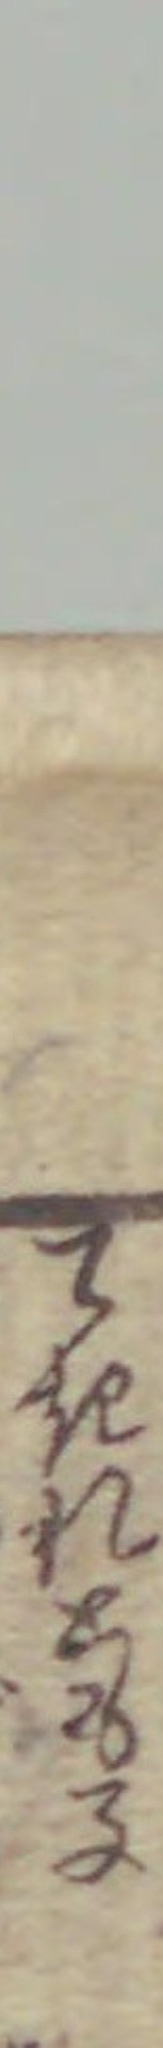てきれとも子
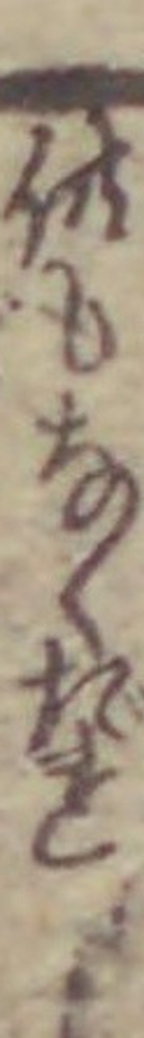供もなくだれ
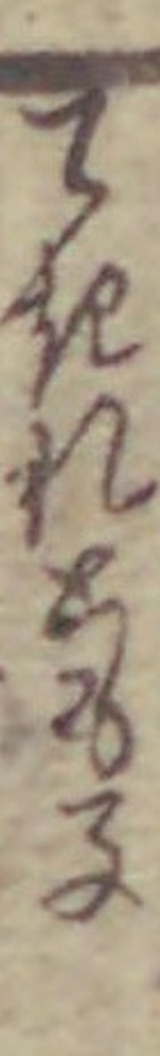てきれとも子
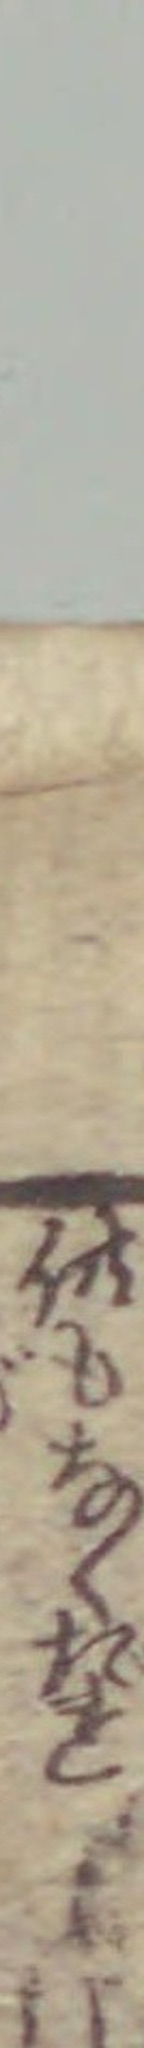供もなくだれ
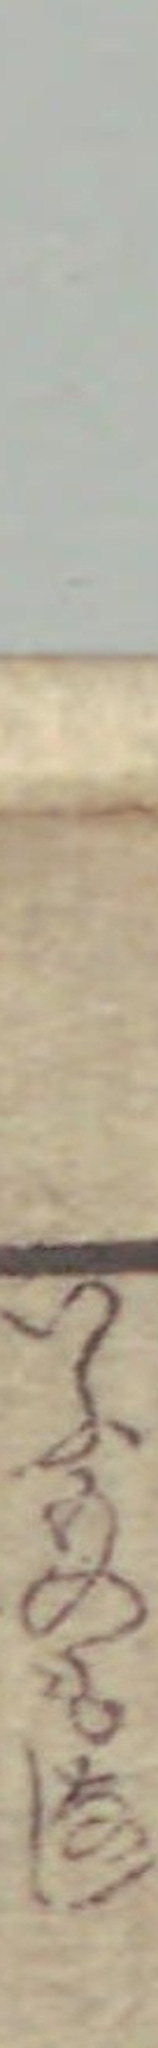いふものもなし
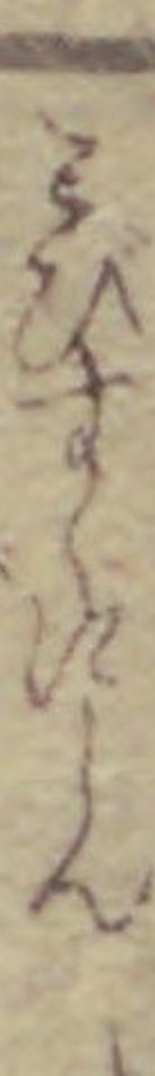こびすくにしん
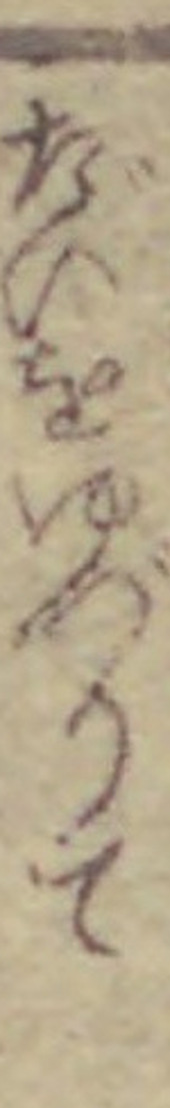だいをゆづりて
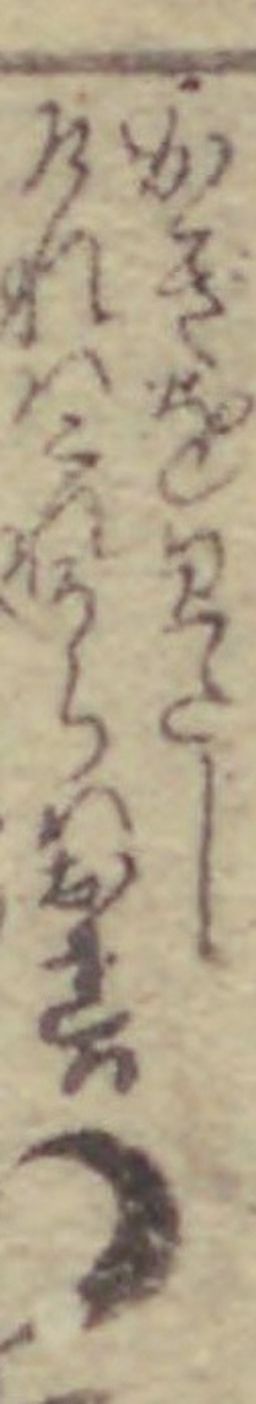けれはこれからはおれか
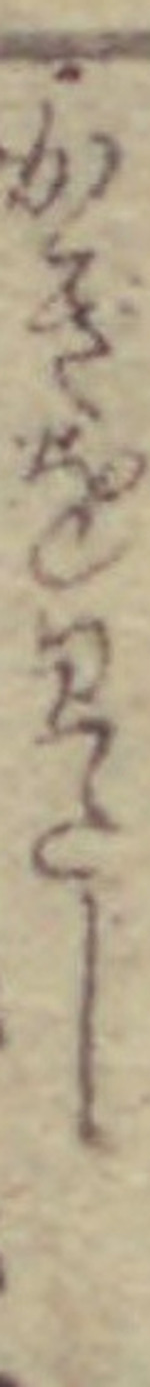かぎをわたし
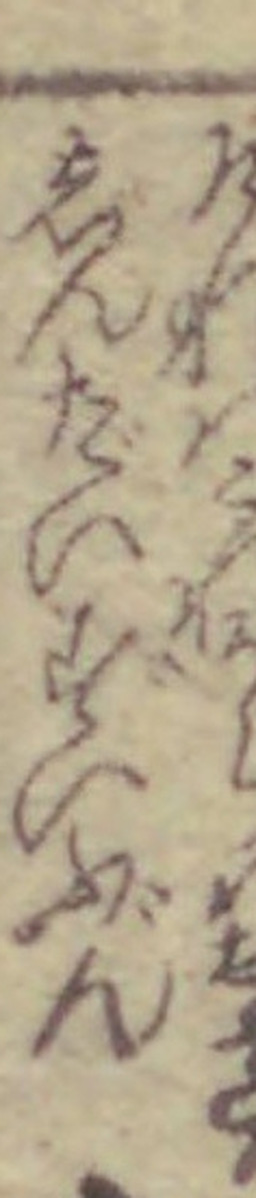しんだいずいぶん
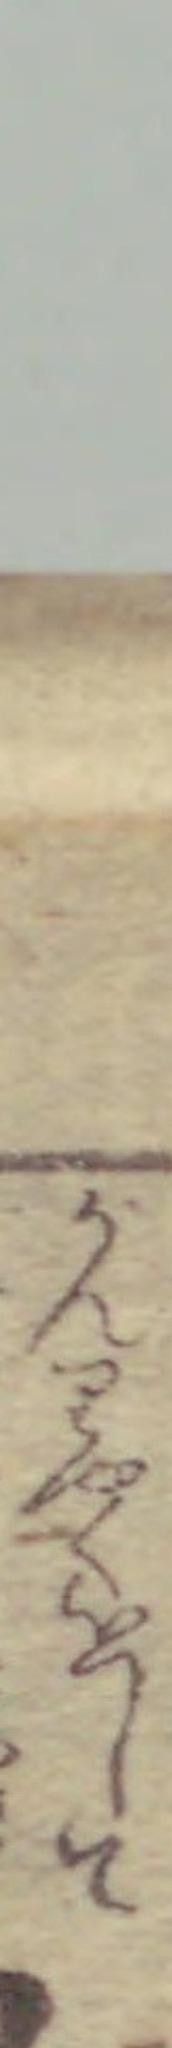かんりやくをして
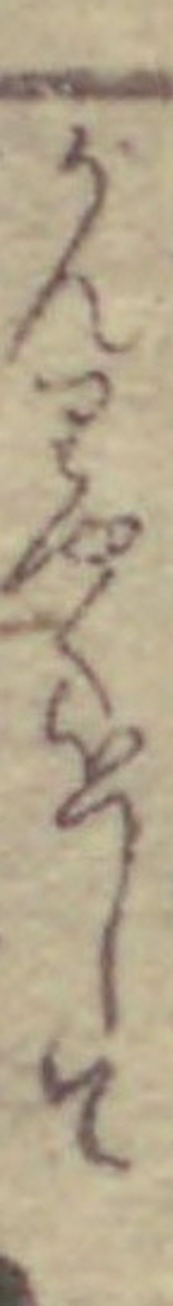かんりやくをして
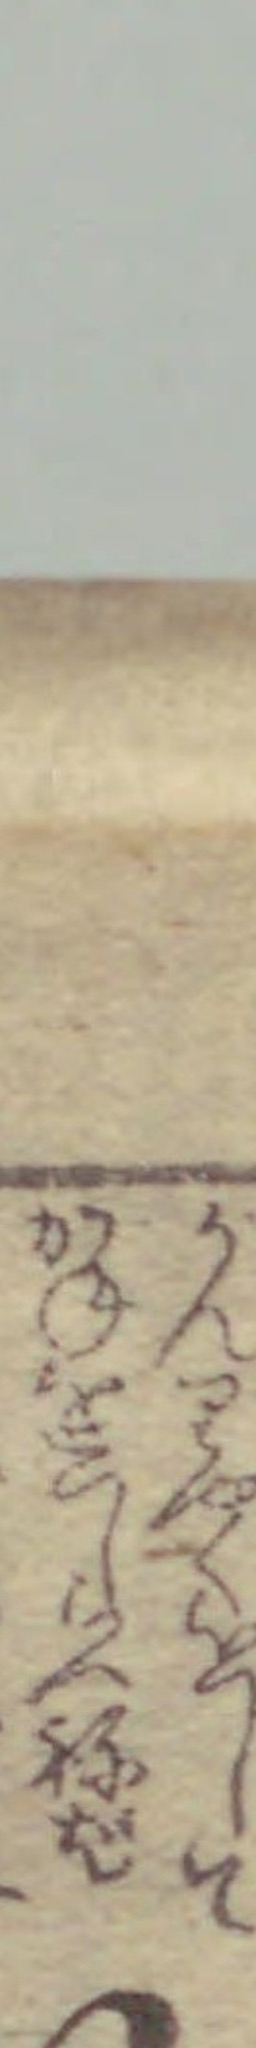かねをこしらへねば
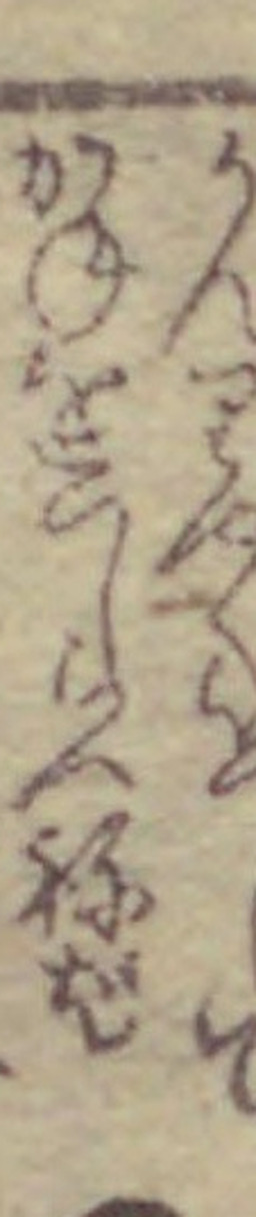かねをこしらへねば
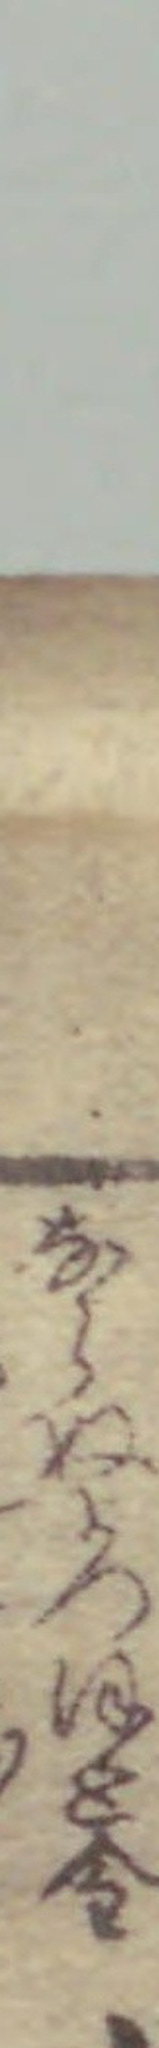ならぬよつほと金
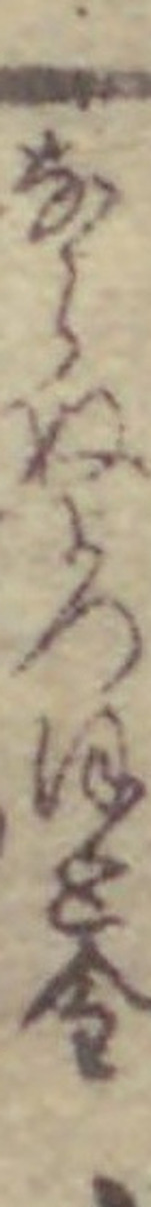ならぬよつほと金
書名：思事夢濃枕 3巻
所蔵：国立国会図書館 National Diet Library, JAPAN
